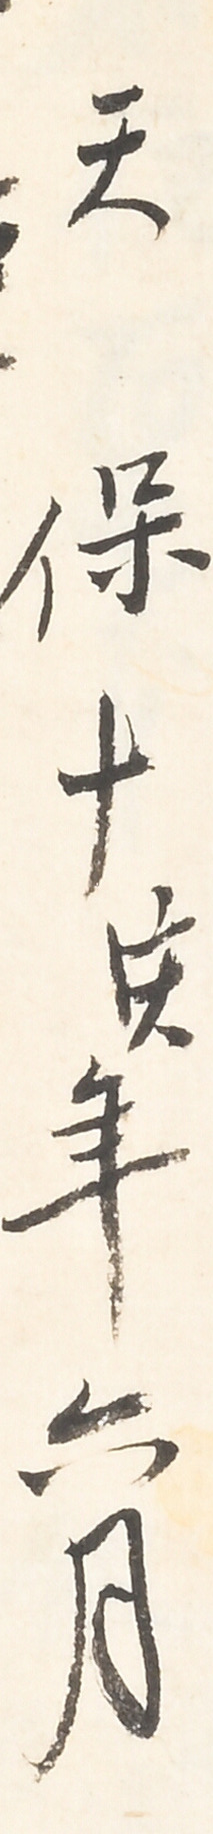天保十亥年六月
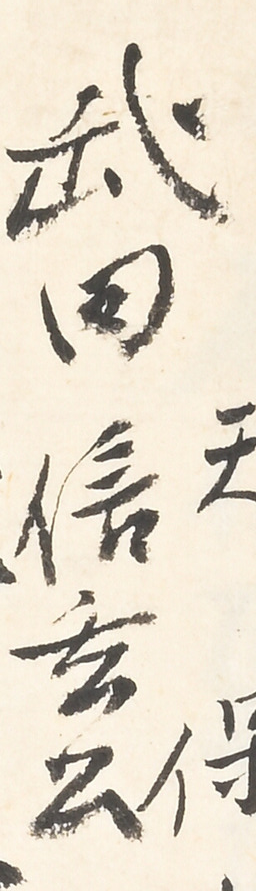武田信玄公
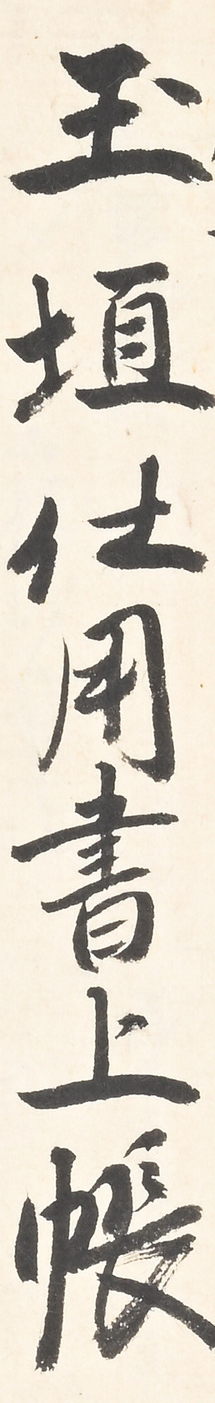玉垣仕用書上帳
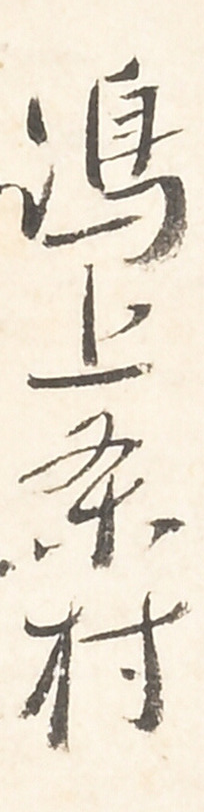島上条村
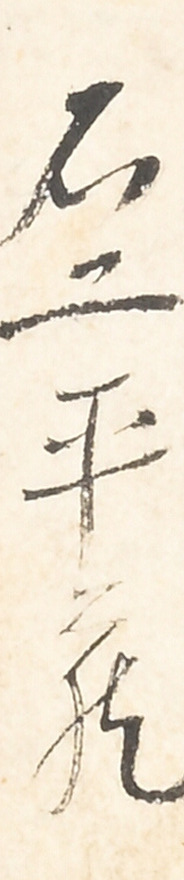石工平蔵

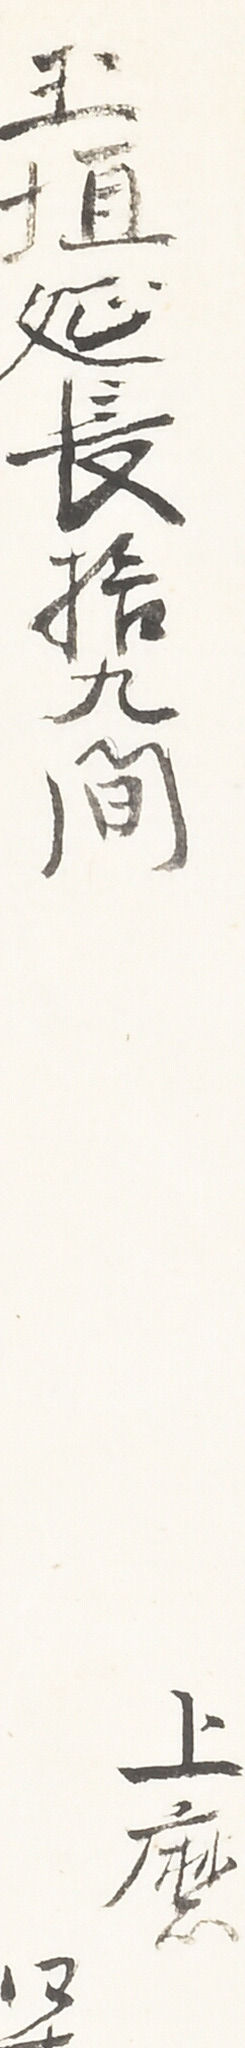玉垣延長拾九間上磨
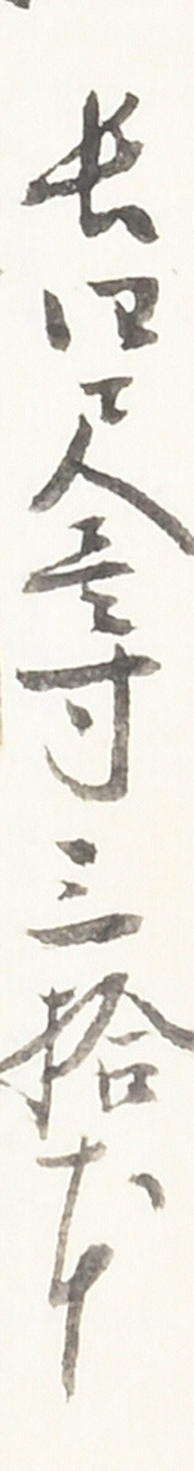長四尺壱寸三拾本
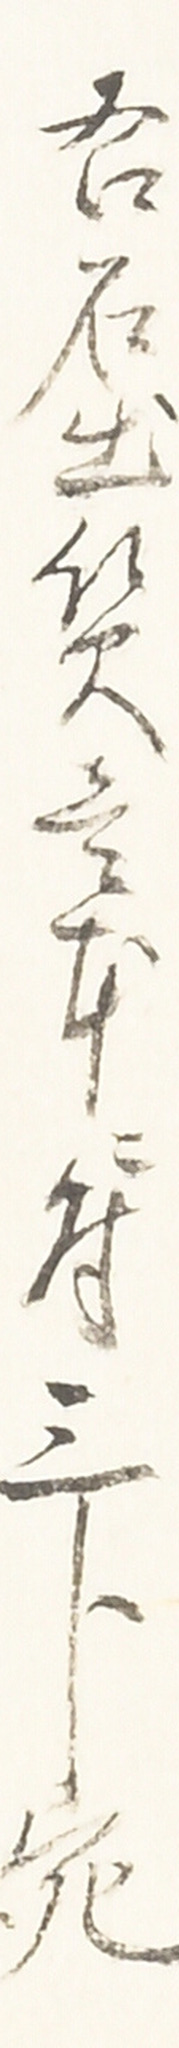右石出賃壱本ニ付三分宛
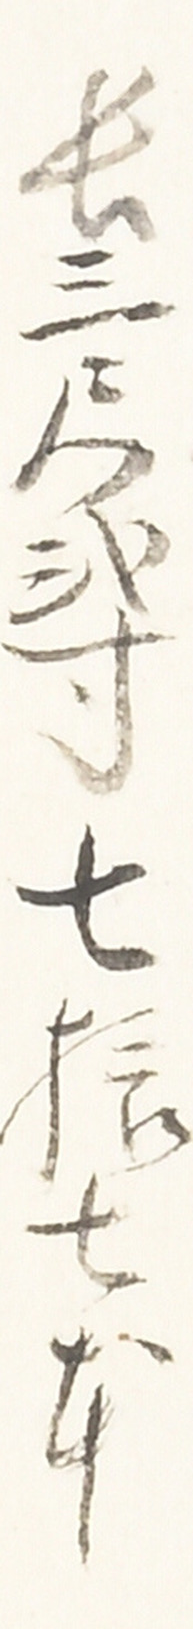長三尺弐寸七拾七本
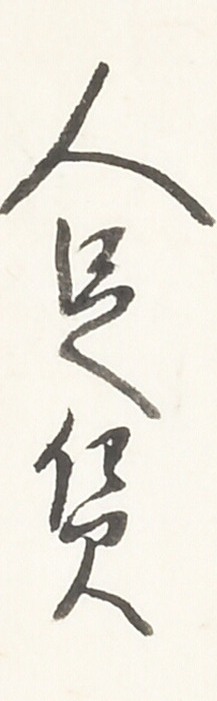人足賃
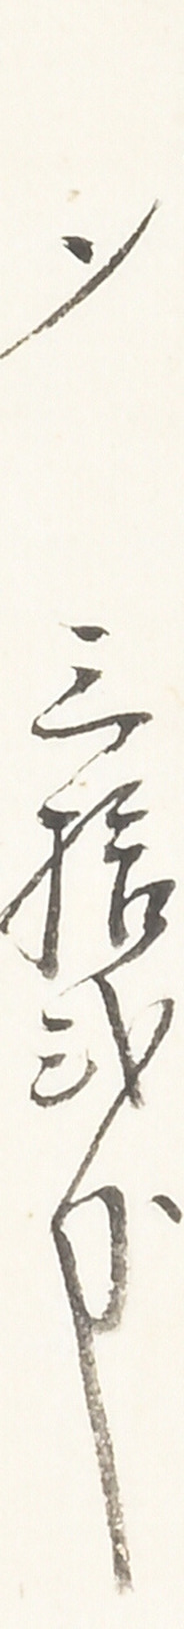〆三拾弍匁
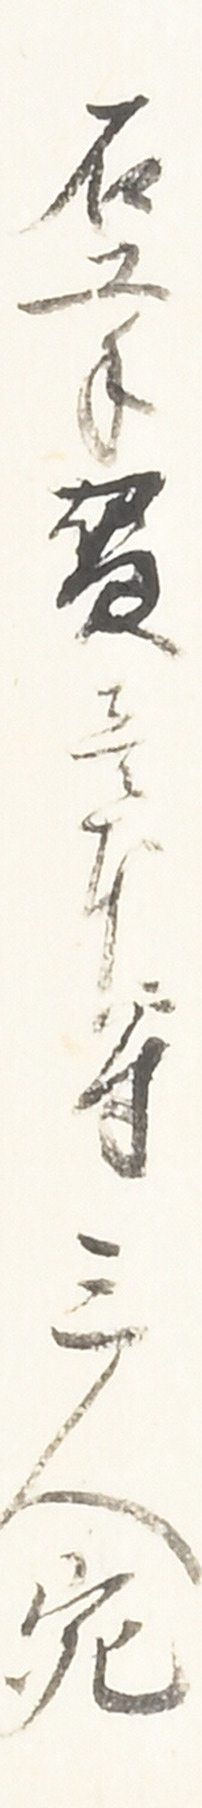石工手賃壱本ニ付三人宛
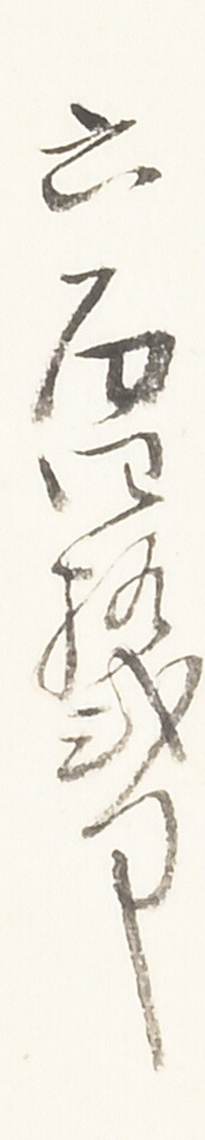〆六百四拾弐匁

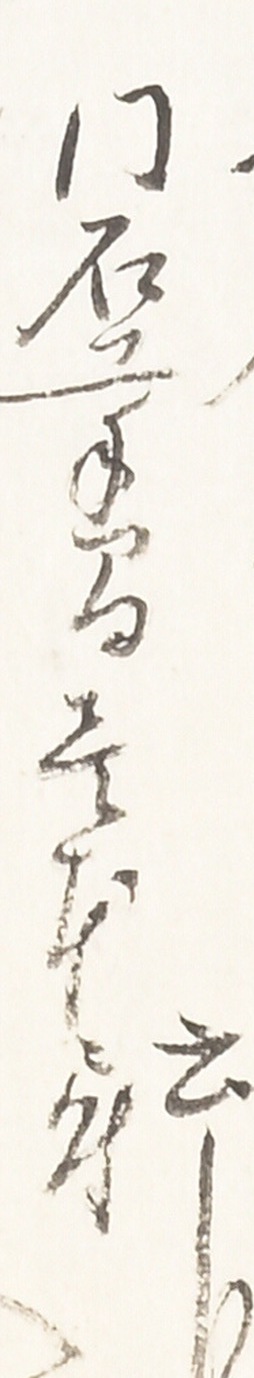同石工手間壱本ニ付
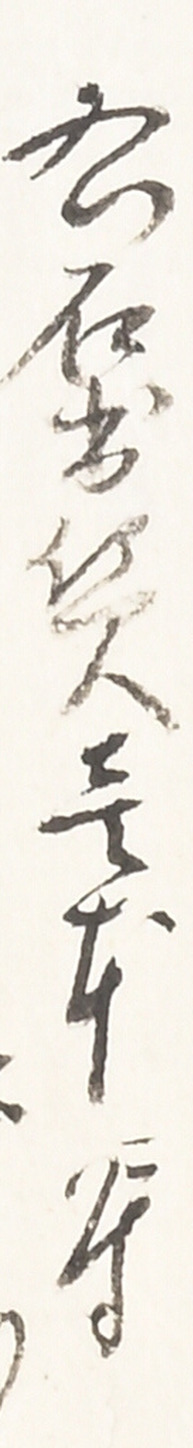右石出賃壱本ニ付
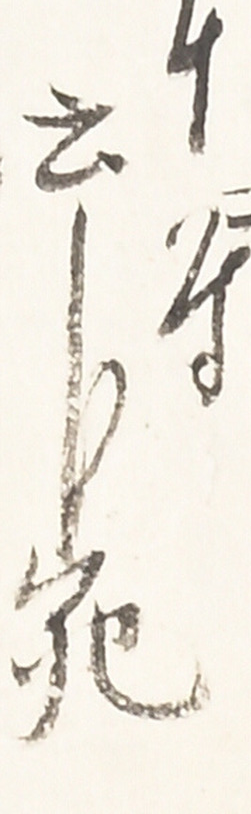六分宛
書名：天保十亥年六月武田信玄公玉垣仕用書上帳
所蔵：伊那市立高遠町図書館・合同会社AMANE
